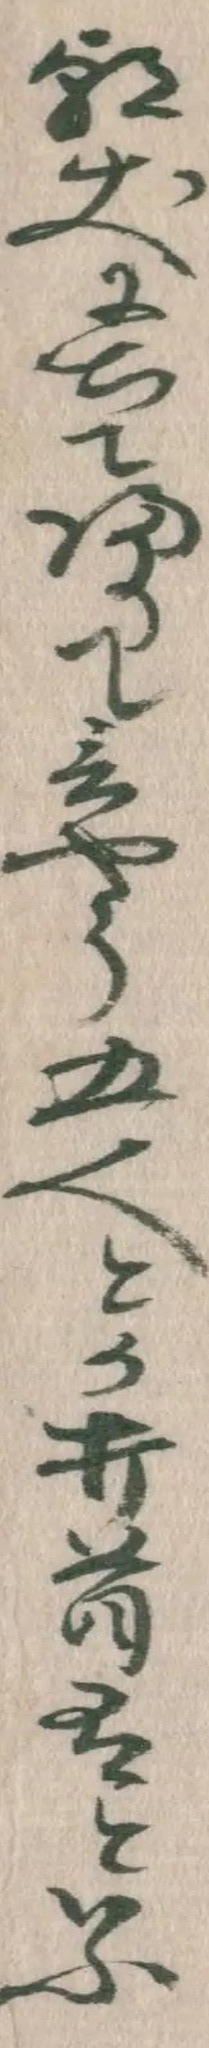朝丈に出て帰りて言やう五人とか打首有といふ
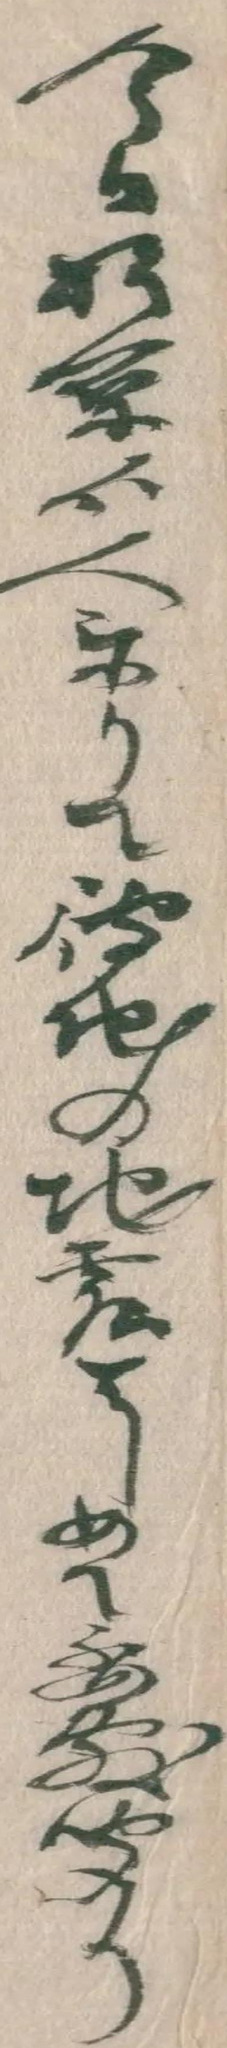今日杵築ゟ人参りて彼地の地震はしめて委敷聞り
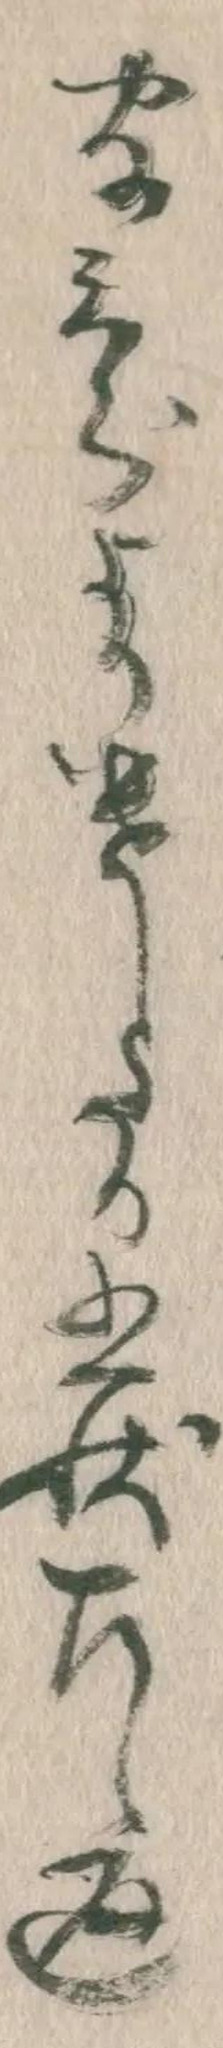官三郎より遣したる書状左之通
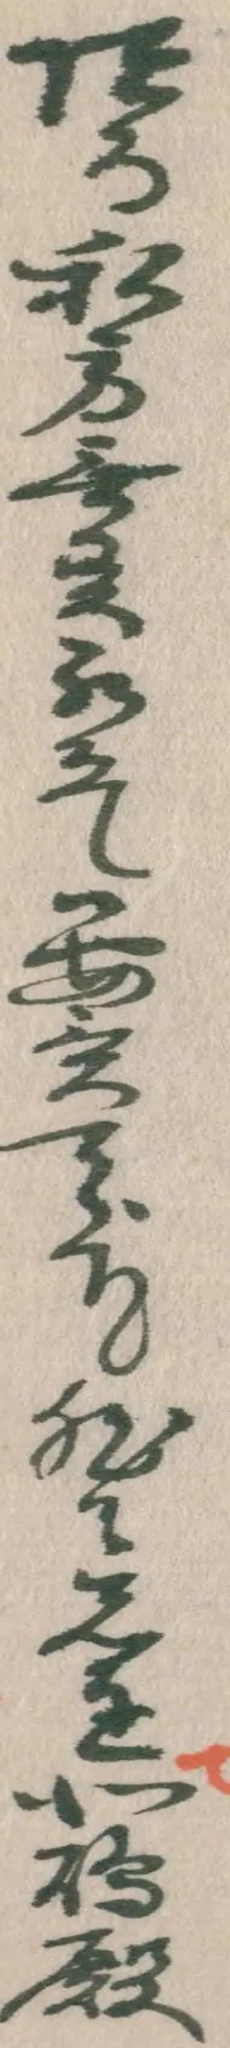随而私方無異罷在候御安意可被下候然は先達て北嶋殿
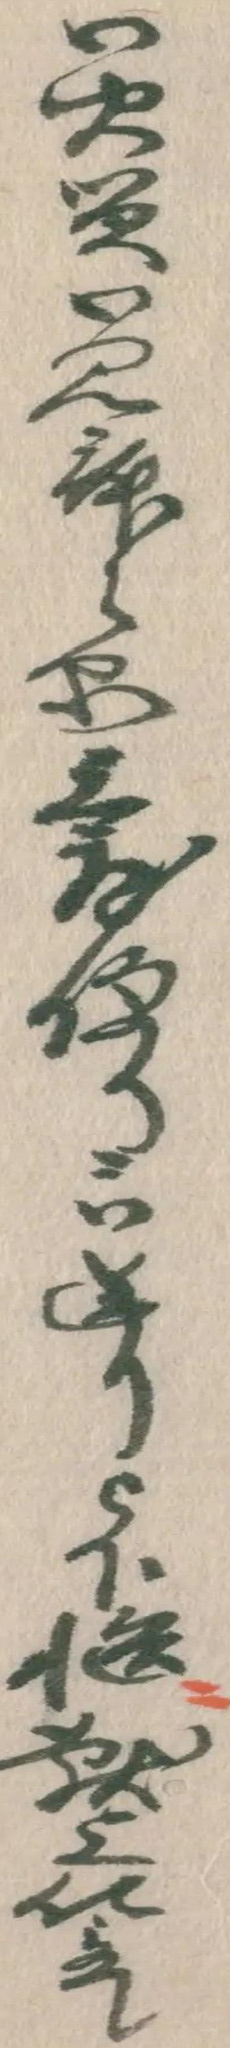御火災御見舞之品三度便りに御送り被下慥に献上仕置候

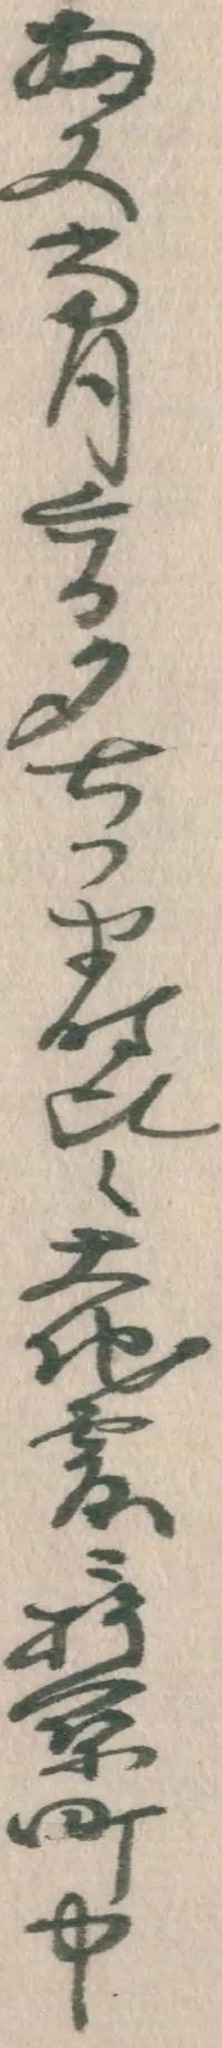扨又当月六日夕七つ半時頃に大地震に杵築町中
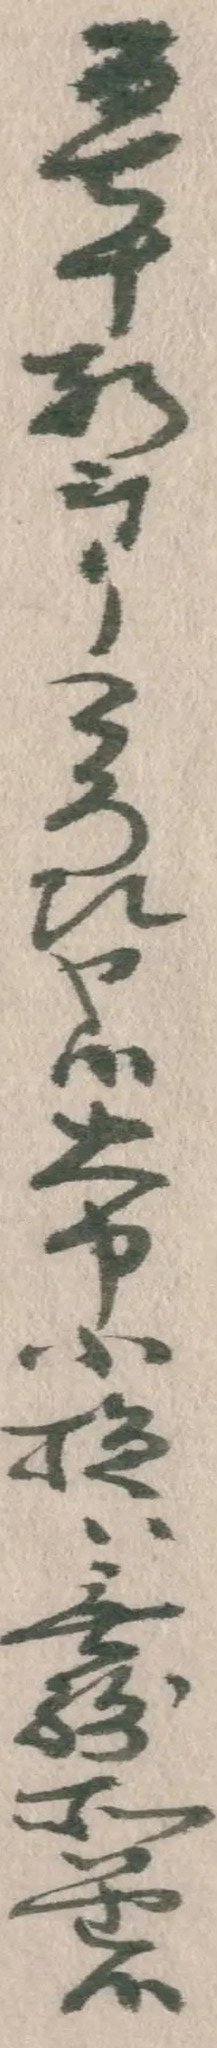百七十軒計りころひ申候大中小損は無残所御坐候
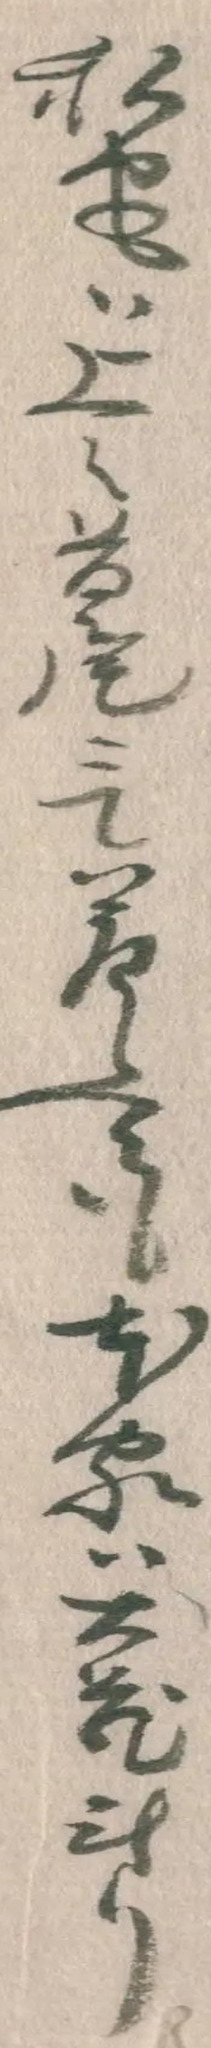私宅は上々首尾にて御座候へとも本家は土蔵計り
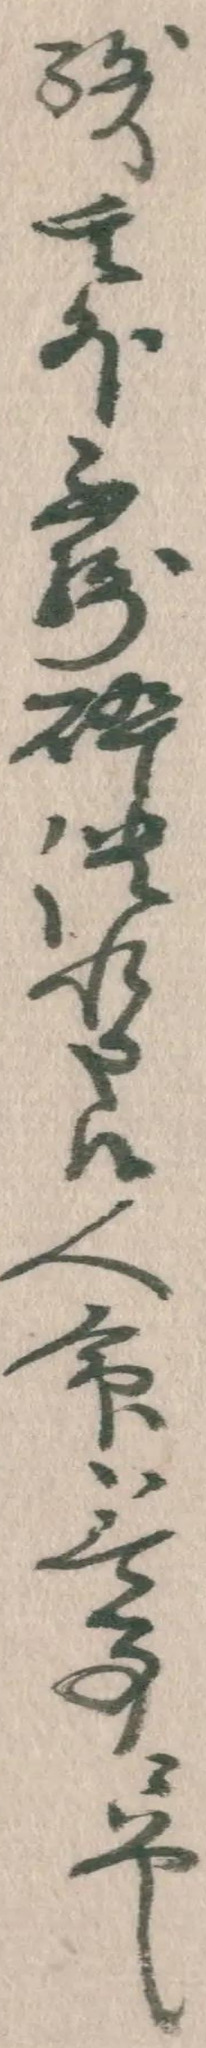残り其外不残砕潰れ申候人命は無事に御坐候
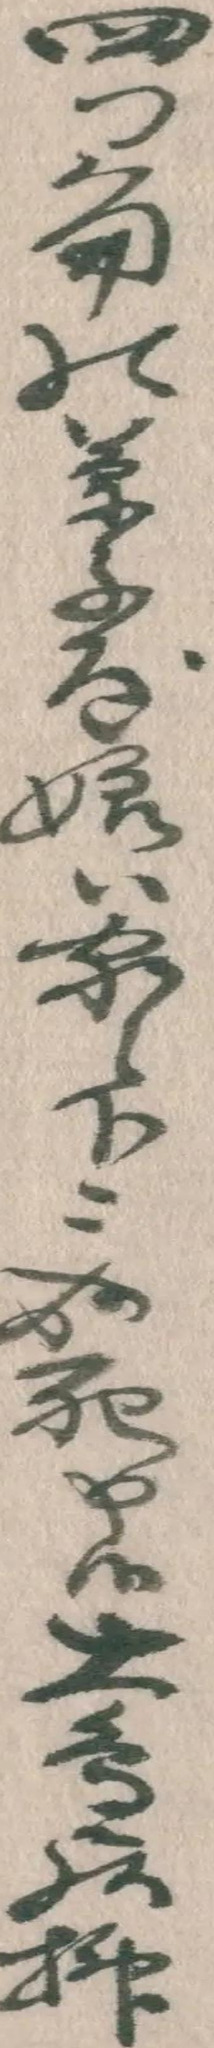四つ角の菓子屋娘は家之下に成死申候大鳥居抑
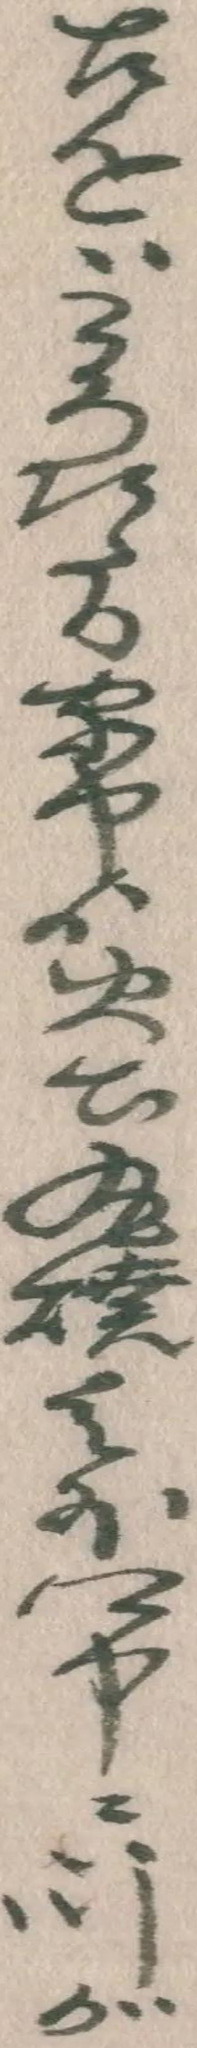左近はころひたる家中ゟ火出丸焼其外郷中には川が
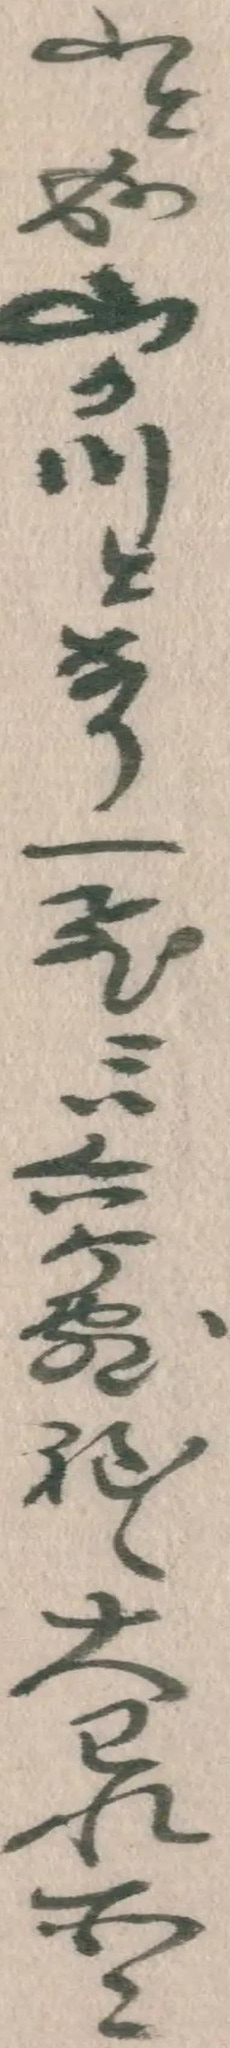山と成山が川となり一飛には六ケ処程之大われ所々
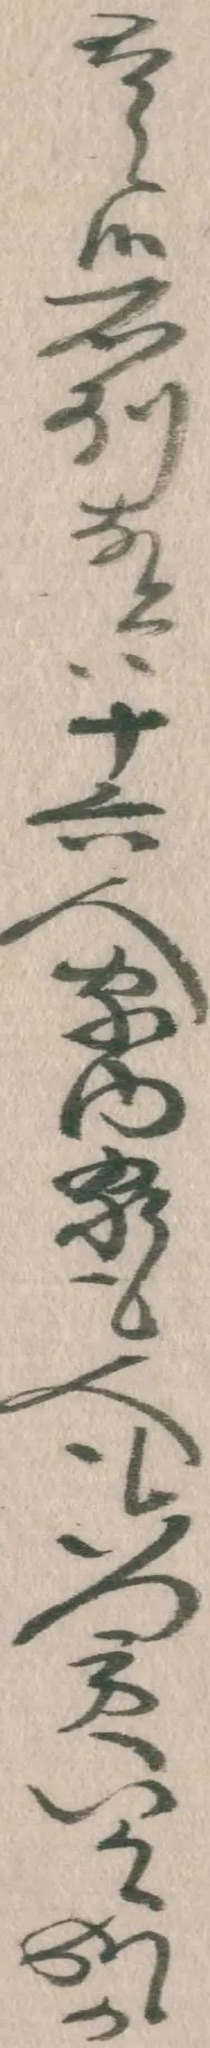有之候石州なとは十六人家内家も人もいつ方へいかゝ成候か
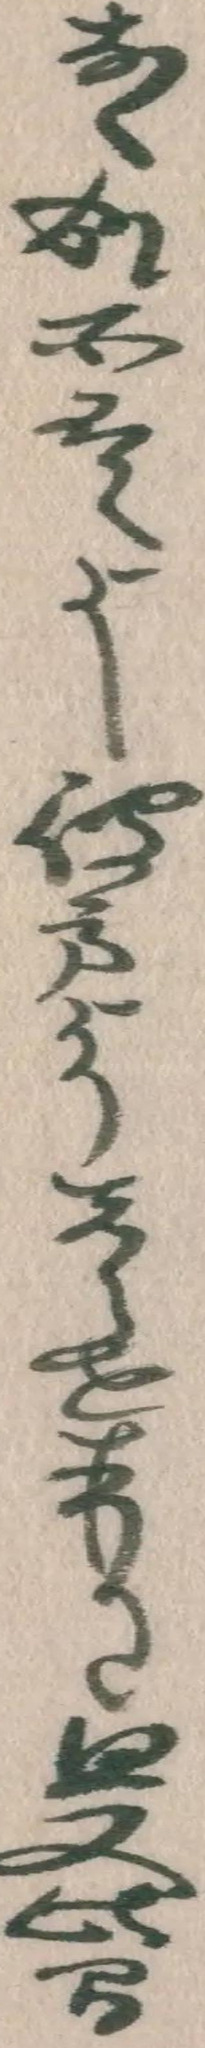なく成候所有之よし彼方より知らせ来り候且又此間
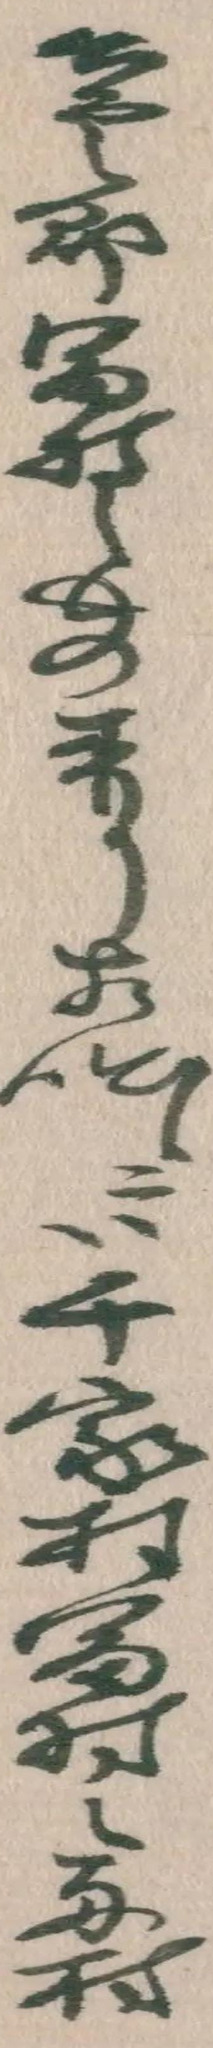出雲郡冨村之もの来り相咄候には千家村冨村之両村
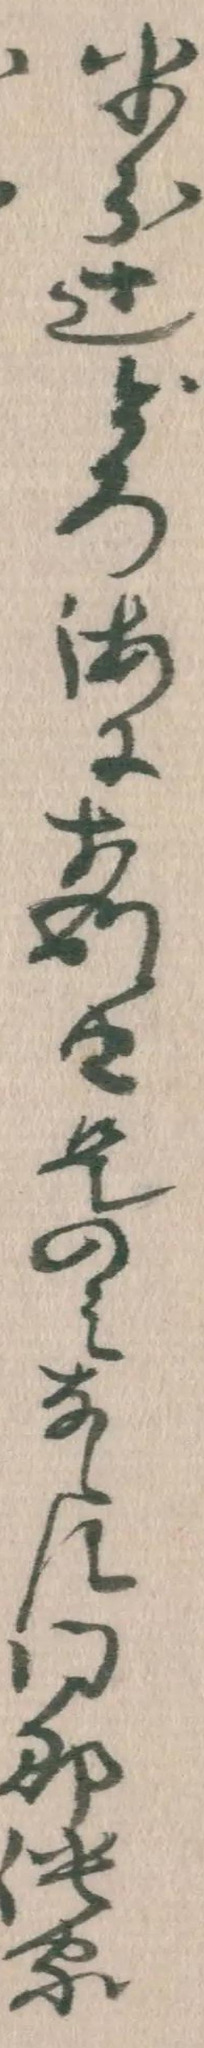半分辻どろ海に相成候由是のみならす同郡潰家
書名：出雲紀行. 20
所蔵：国立国会図書館 National Diet Library, JAPAN
